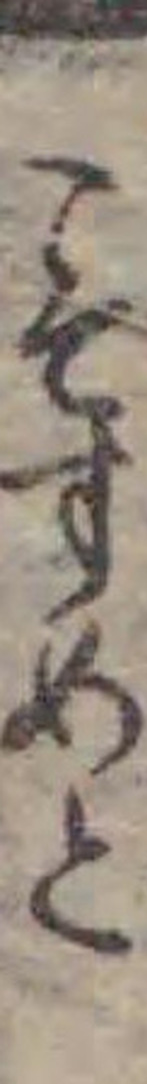こそすめと
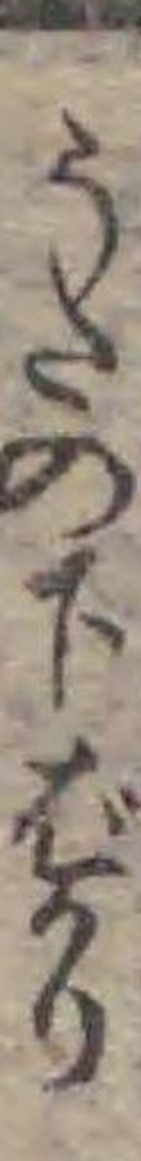うたの下ばかり
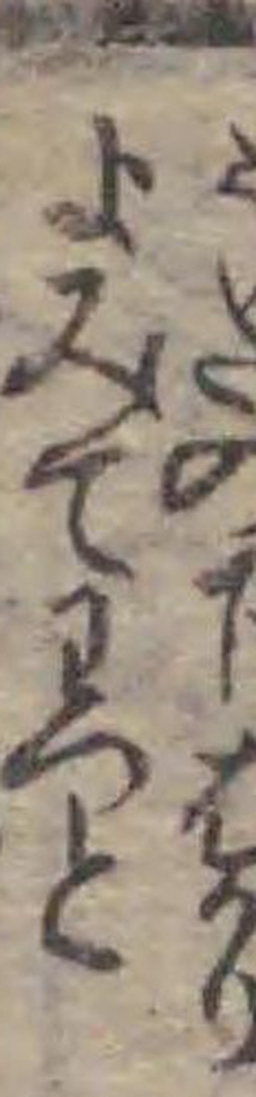よみてわつと
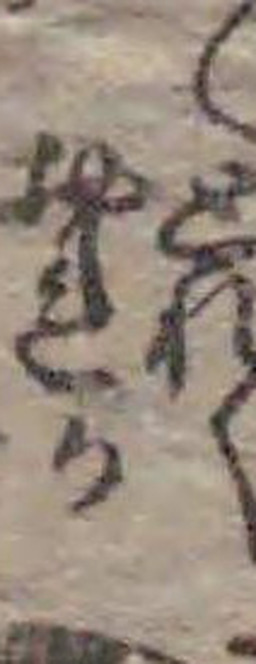おれか
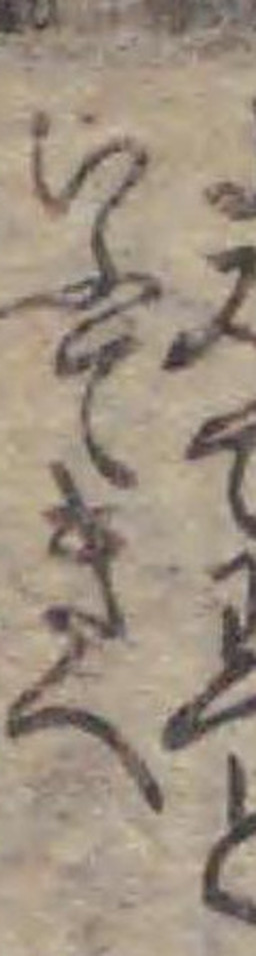いふてきへ
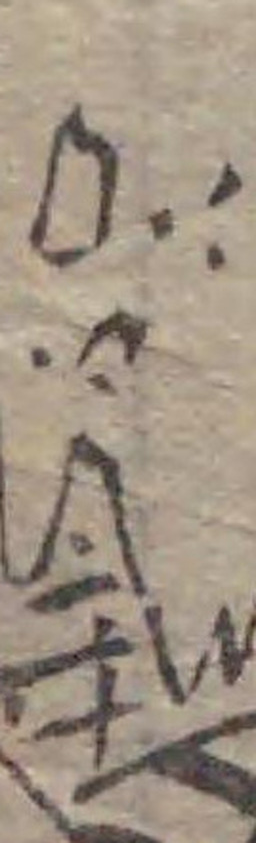地口の
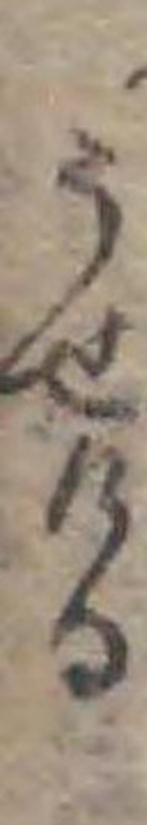うせける
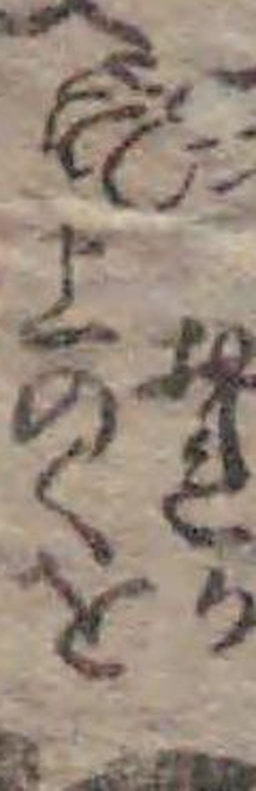上のくを
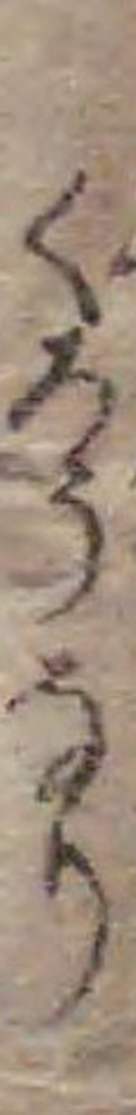くろうなり
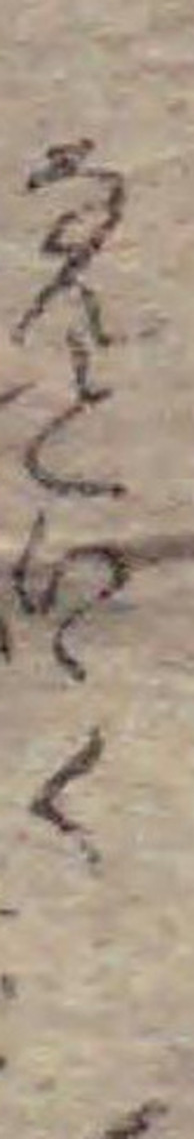なんといゝく
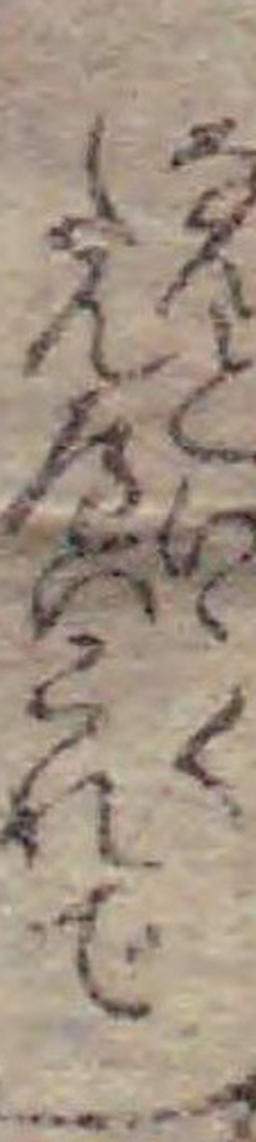たんへいこれで
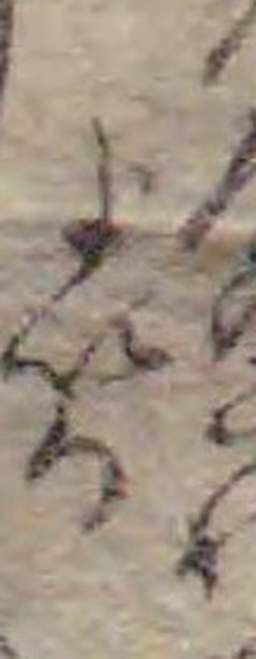よいか
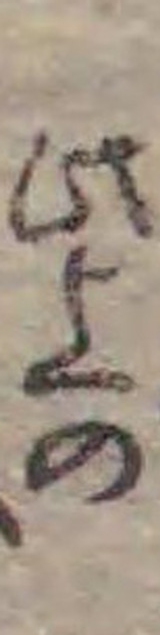此上の
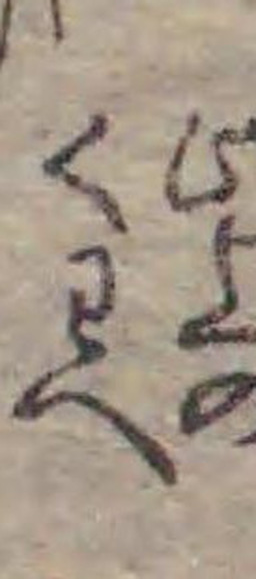くわへ
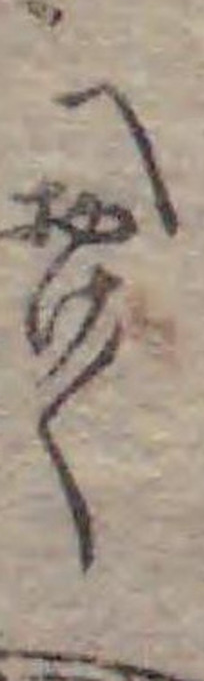〽おけ〳〵
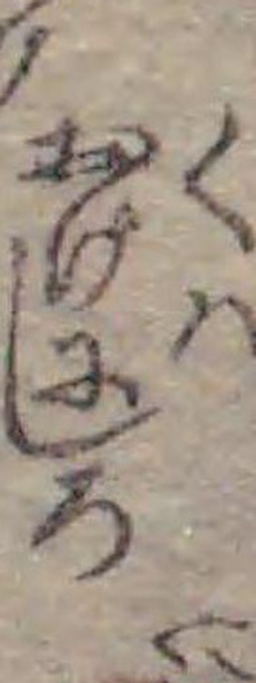おけにしろ
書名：歌の化物一寺再興 : 2巻
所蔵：国立国会図書館 National Diet Library, JAPAN
